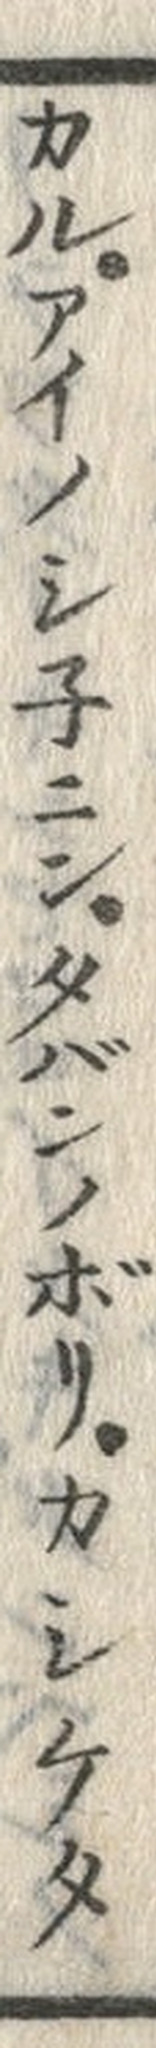カル。アイノシ子ニン。タバンノボリ。カシケタ
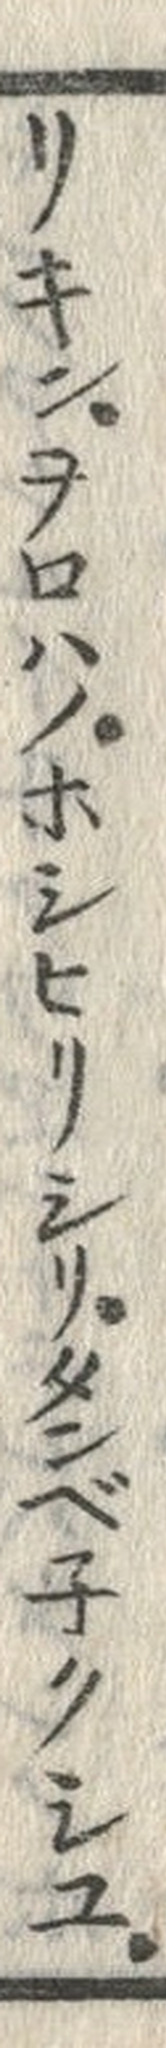リキン。ヲロハノ。ホシヒリシリ。タンベネクシユ。
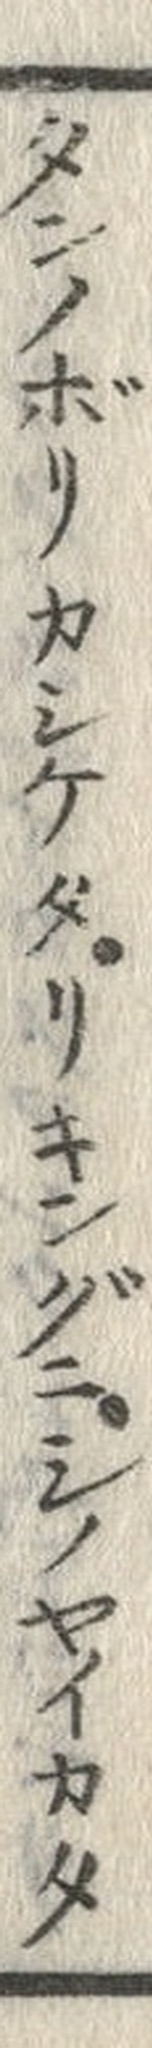タンノポリカシケダ。リキングニ。シノヤイカタ
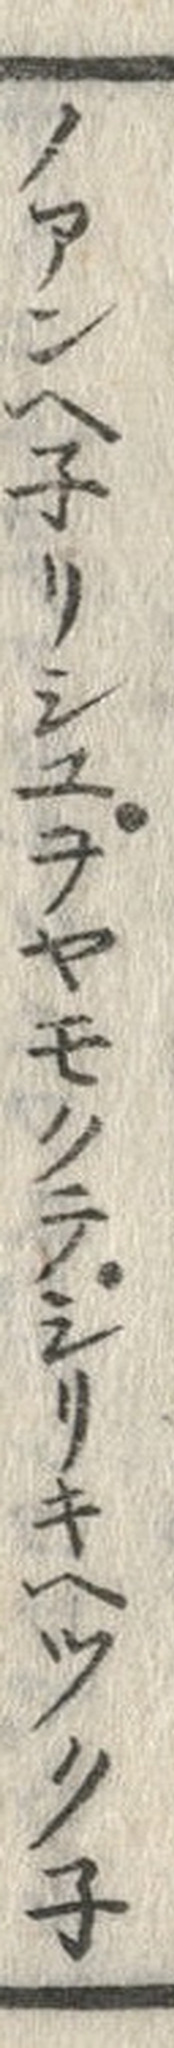ノアンヘネリシユ。ヲヤモクテ。シリキヘツクネ

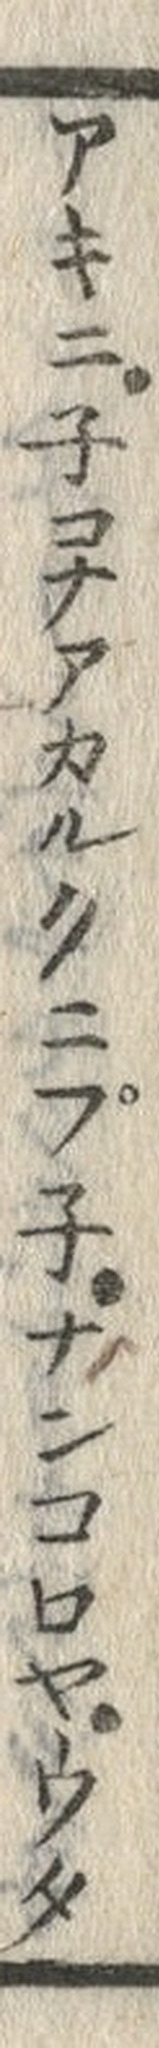アキニ。ネコナアカルクニブネ。ナンコロヤ。ウタ
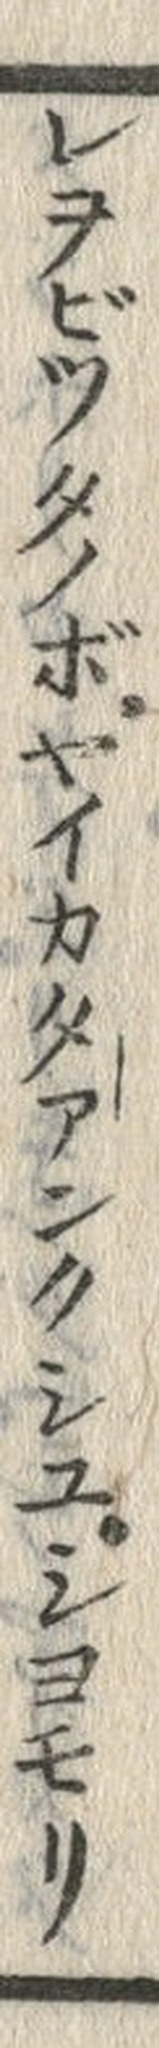レヲビツタノボ。ヤイカタアンクシユ。シヨモリ
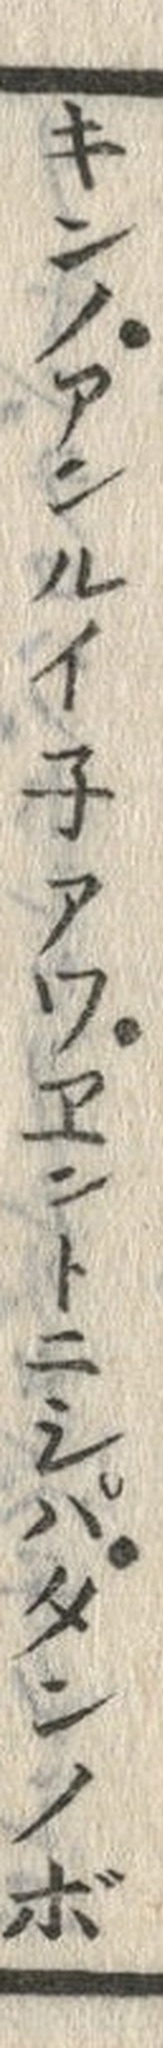キンノ。アンルイネアワ。ヱントニシパ。タンノボ
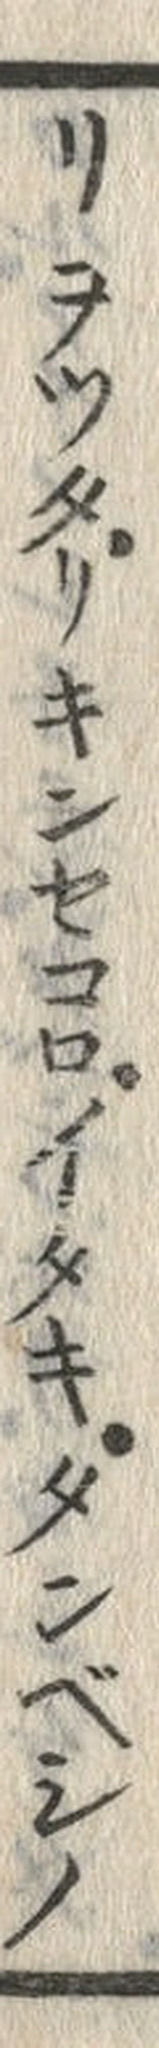リヲツタ。リキンセコロ。イタキ。タンベシノ
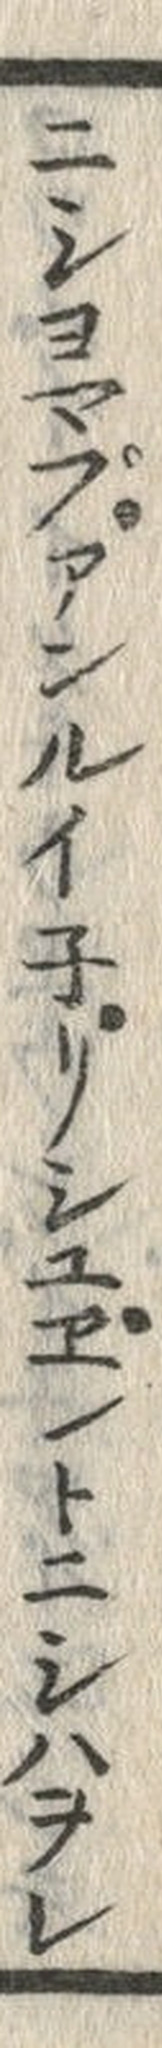ニシヨマプ。アンルイネ。リシユヱントニシハヲレ
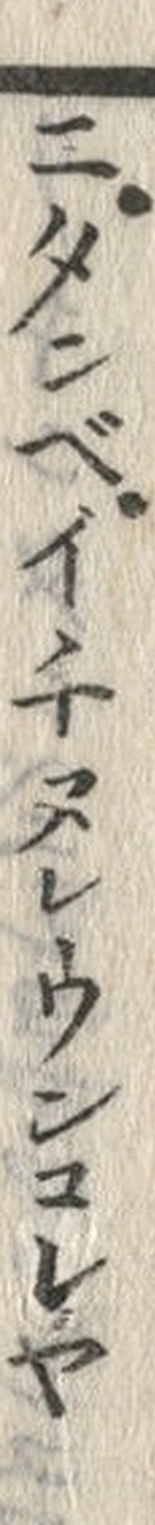ニ。タンベ。イチヌレウンコレヤ
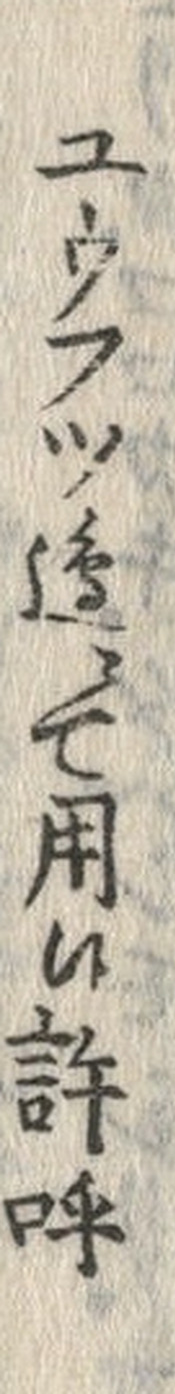ユウフツ辺にて用候許呼
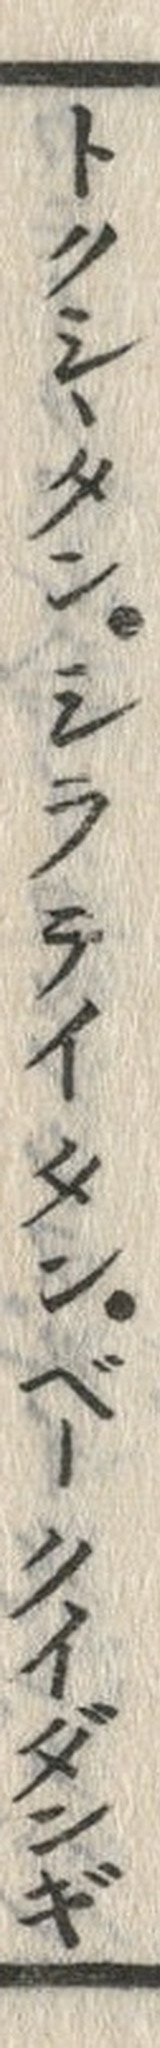トクシヽタン。シラヲイタン。ベークイダンギ
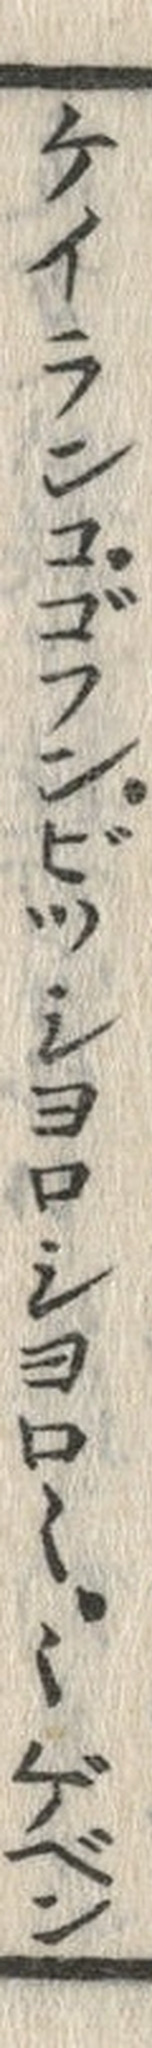ケイランコ。ゴフン。ビツシヨロシヨロ〱。〱ゲベン
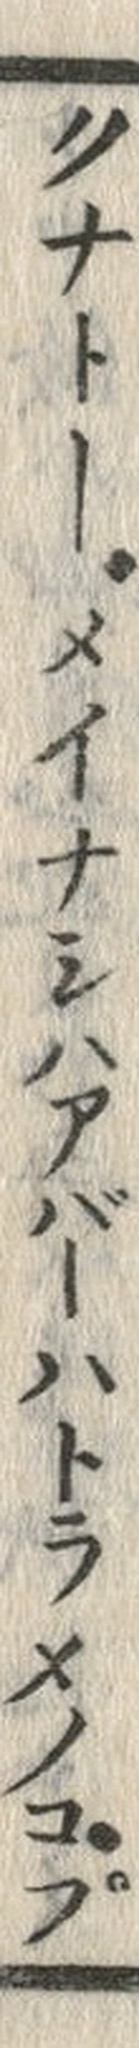クナトー。メイナシハアバーハトラメノコ。プ
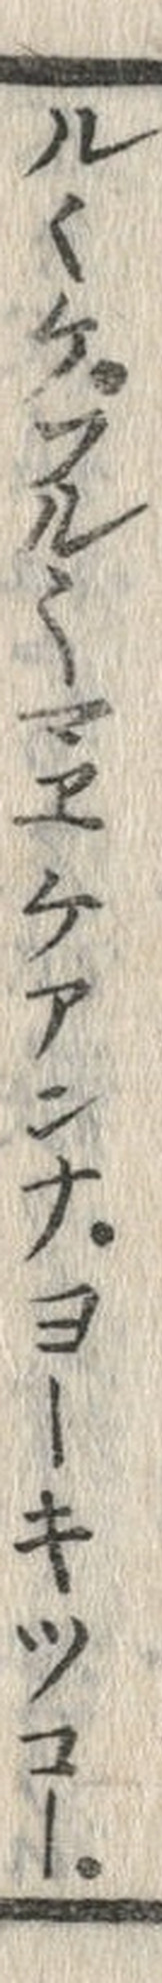ルくケ。フル〳〵マヱケアンナ。ヨーキツコー。
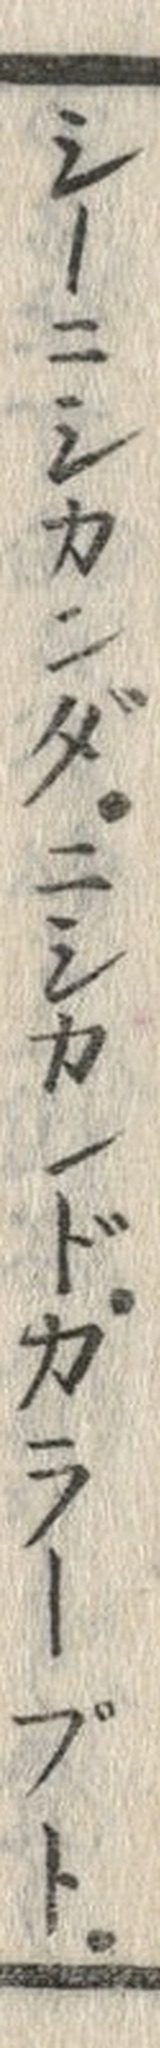シーニシカンダ。ニシカンド。カラープト。
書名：蝦夷方言藻汐草　坤巻
